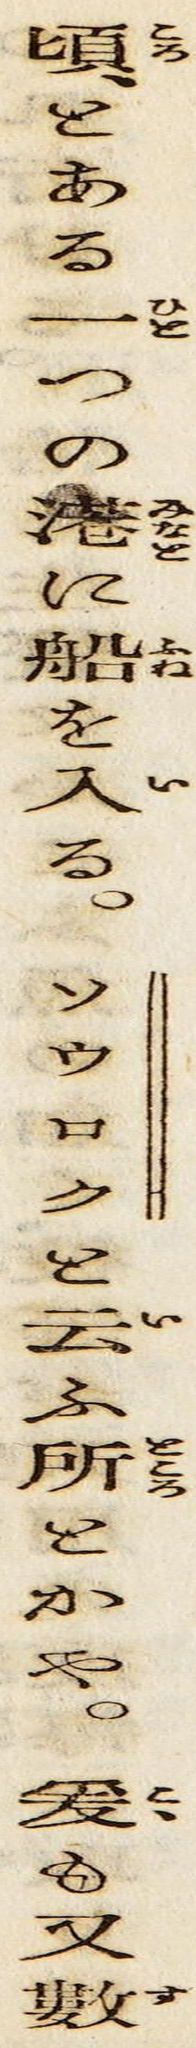頃、とある一つの港に船を入る。ソウロクと云ふ所とかや。爰も又数
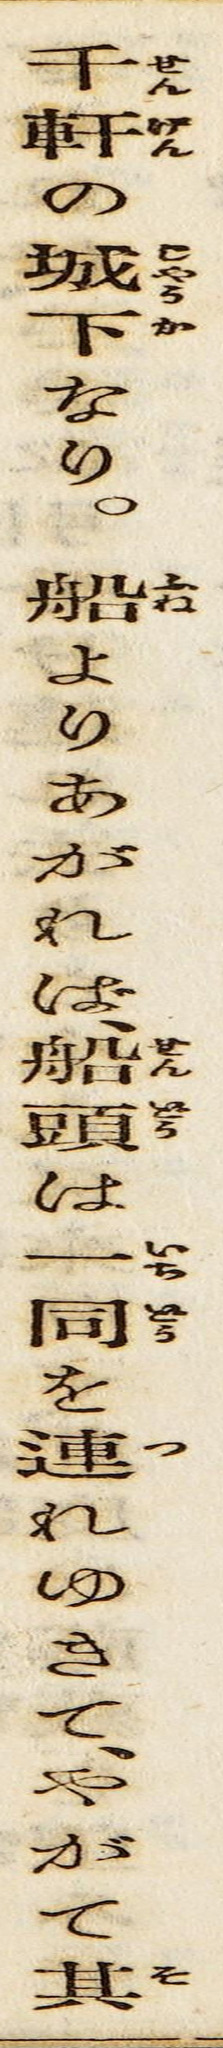千軒の城下なり。船よりあがれば、船頭は一同を連れゆきて、やがて其
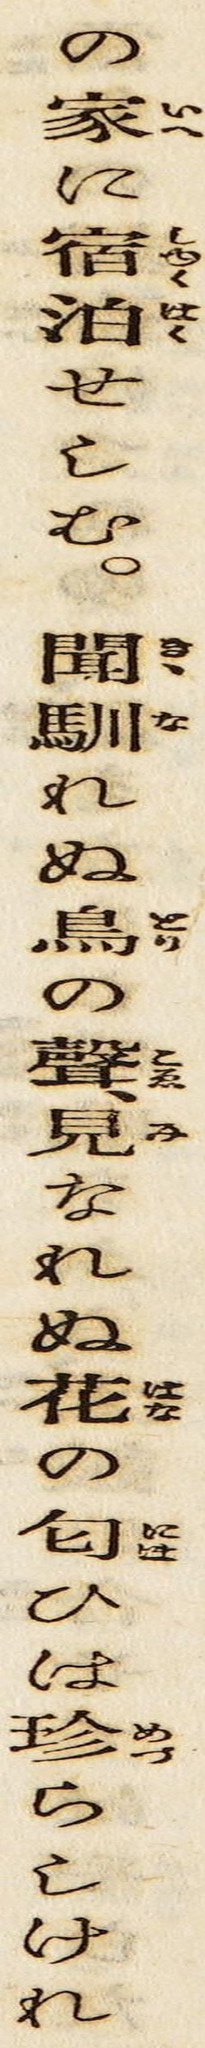の家に宿泊せしむ。聞馴れぬ鳥の声、見なれぬ花の匂ひは珍らしけれ
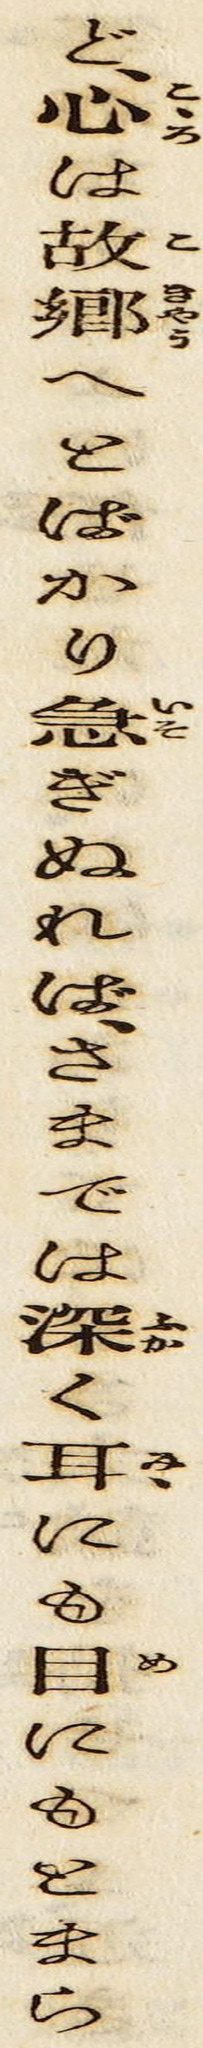ど、心は故郷へとばかり急ぎぬれば、さまでは深く耳にも目にもとまら
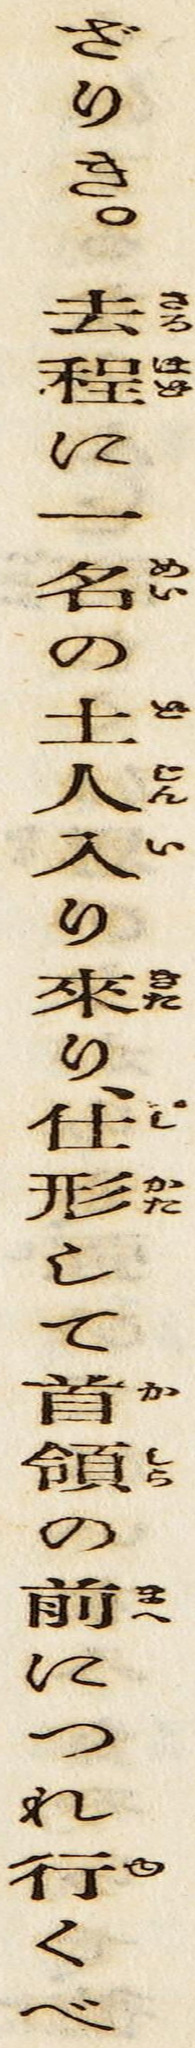ざりき。去程に一名の土人入り来り、仕形して首領の前につれ行くべ
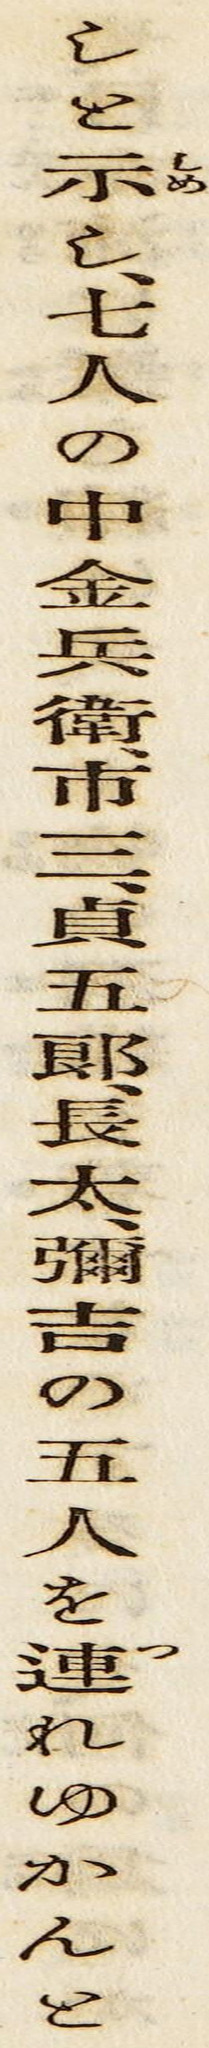しと示し、七人の中金兵衛、市三、貞五郎、長太、弥吉の五人を連れゆかんと
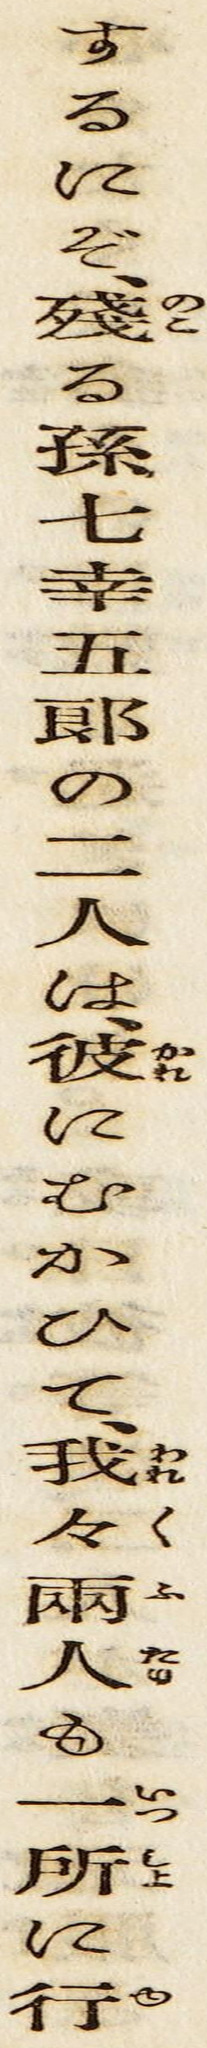するにぞ、残る孫七幸五郎の二人は、彼にむかひて、我々両人も一所に行
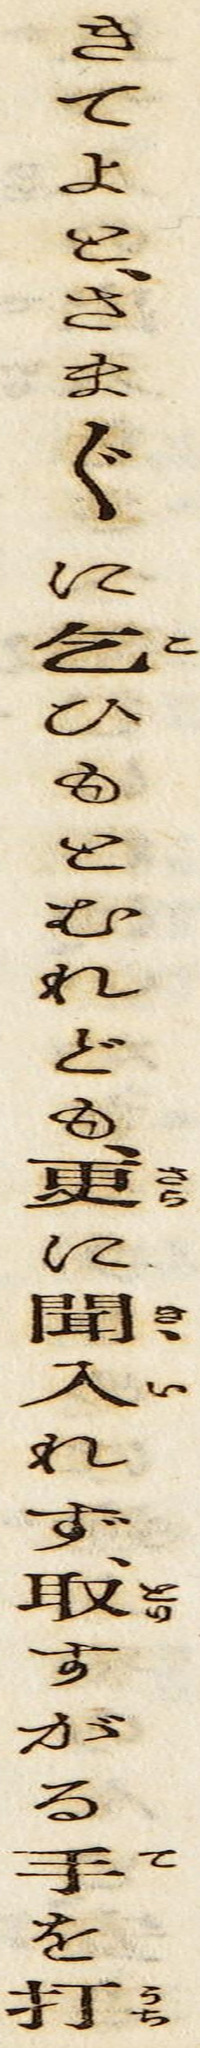きてよと、さま〴〵に乞ひもとむれども、更に聞入れず、取すがる手を打
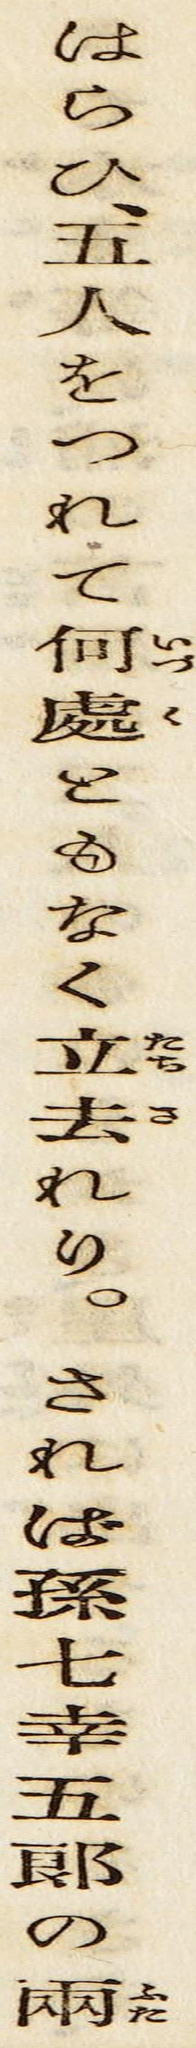はらひ、五人をつれて何処ともなく立去れり。されば孫七幸五郎の両
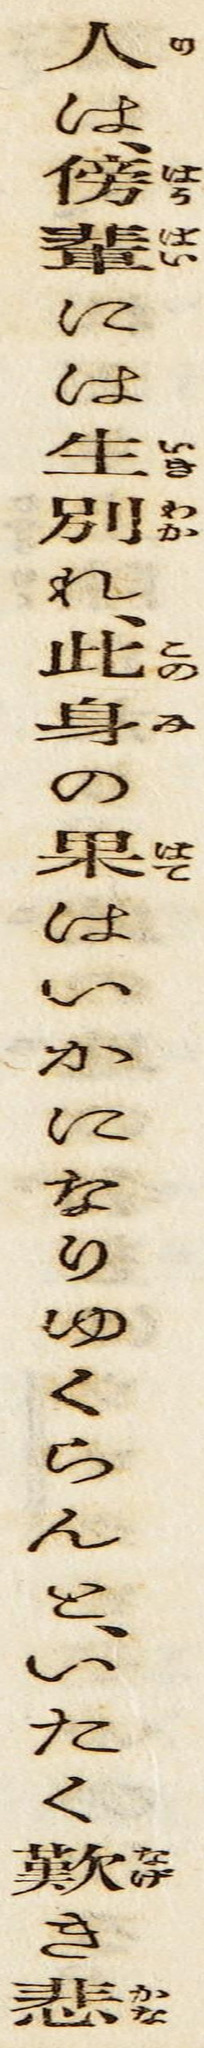人は、傍輩には生れ、此身の果はいかになりゆくらんと、いたく歎き悲
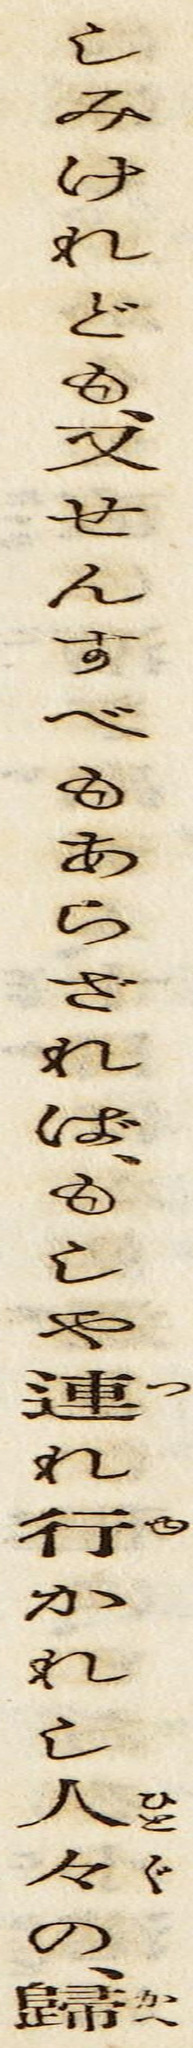しみけれども、又せんすべもあらざれば、もしや連れ行かれし人々の、帰
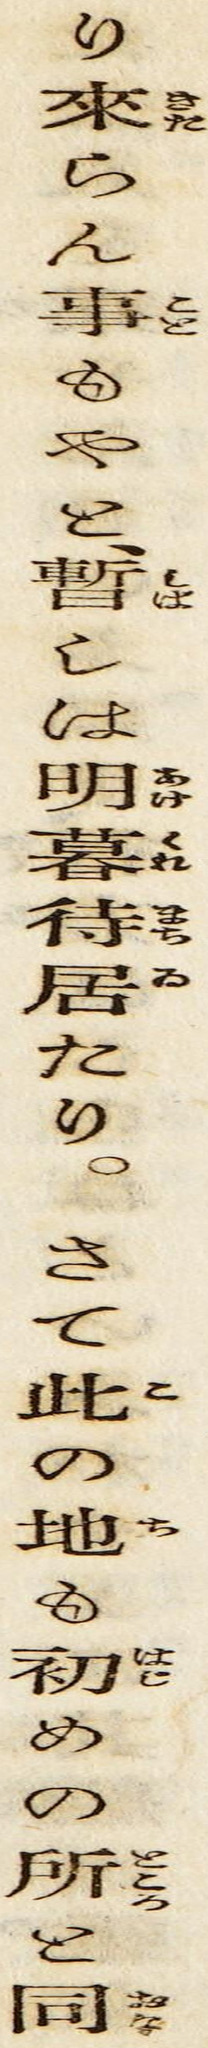り来らん事もやと、暫しは明暮待居たり。さて此の地も初めの所と同
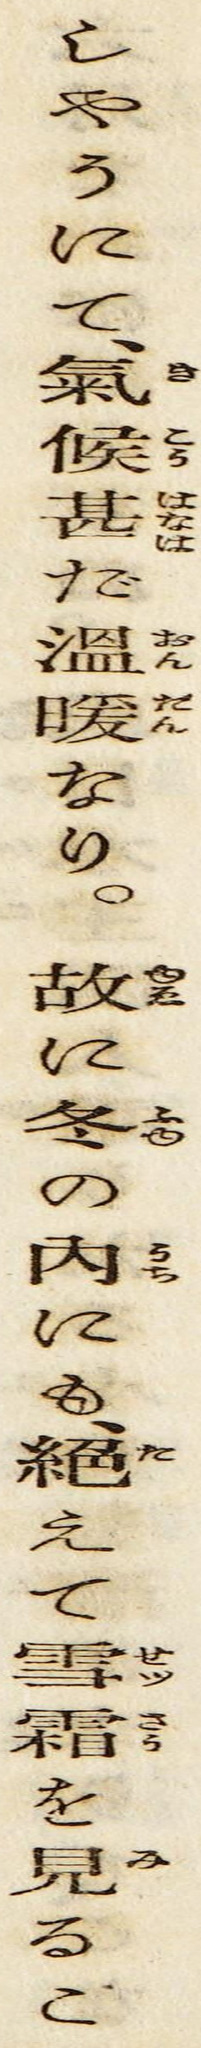しやうにて、気候甚だ温暖なり。故に冬の内にも、絶えて雪霜を見るこ
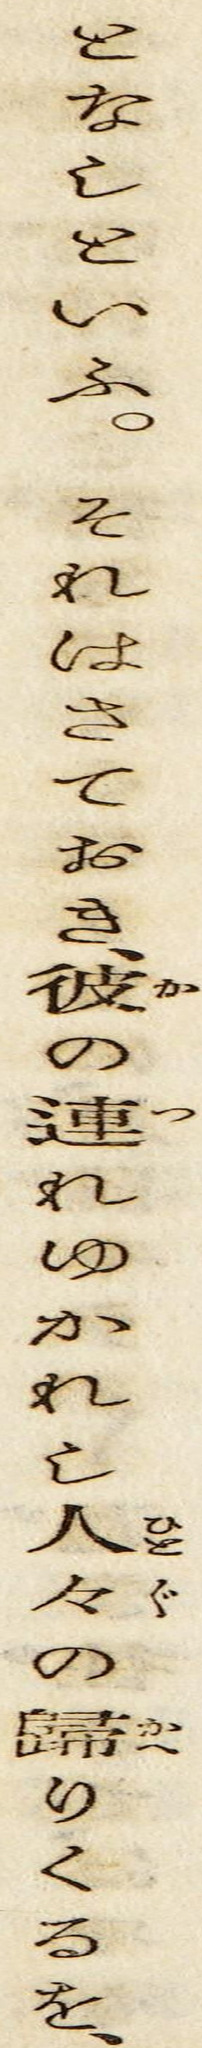となしといふ。それはさておき、彼の連れゆかれし人々の帰りくるを、

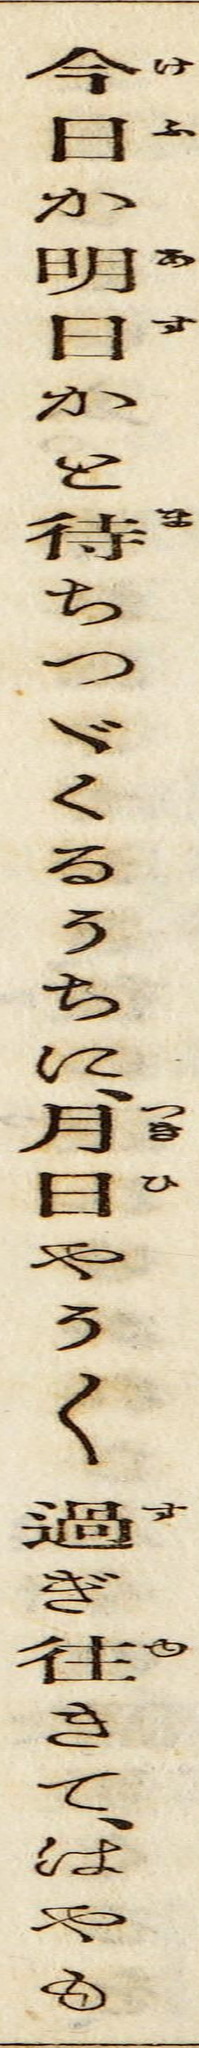今日か明日かと待ちつヾくるうちに、月日やう〳〵過ぎ往きて、はやも
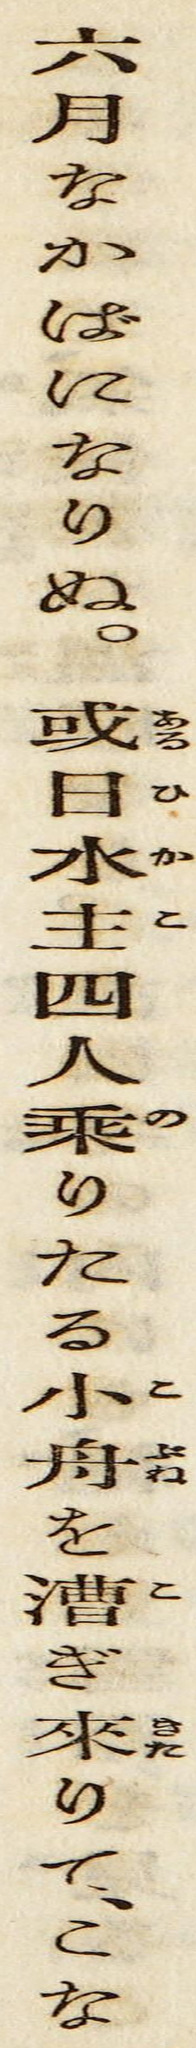六月なかばになりぬ。或日水主四人乗りたる小舟を漕ぎ来りて、こな
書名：日本漂流譚
